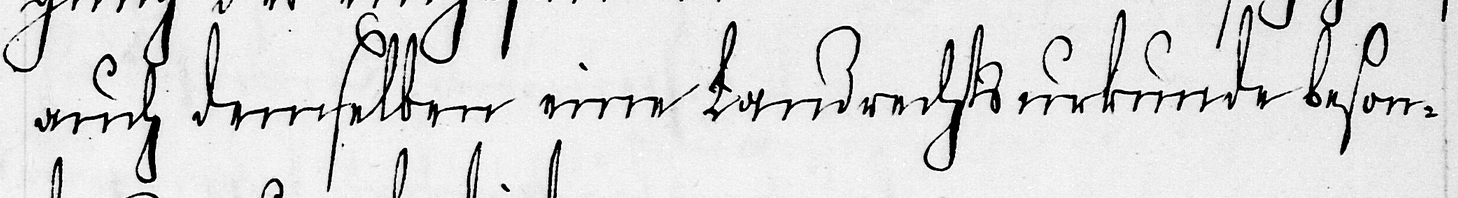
auch demselben eine Landrechtsurkunde beson¬
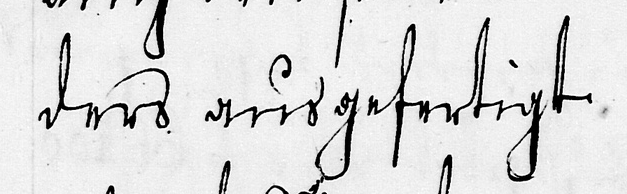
ders ausgefertigt.
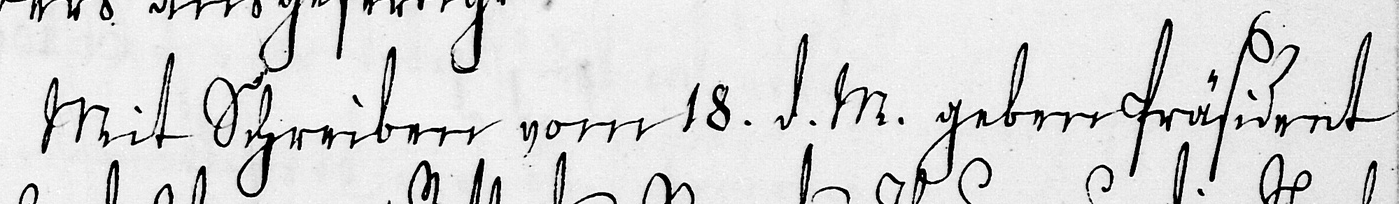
Mit Schreiben vom 18. d. M. geben Präsident
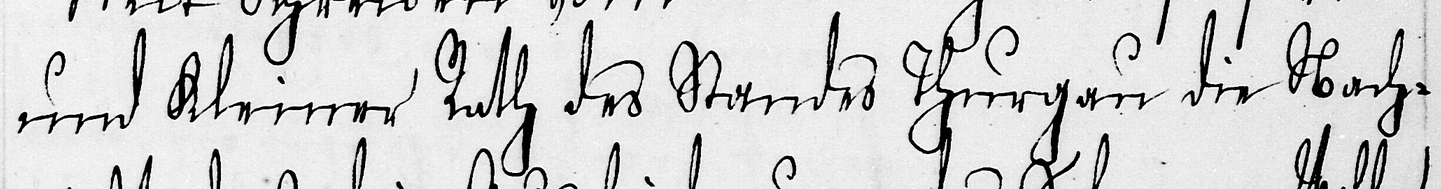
und Kleiner Rath des Standes Thurgau die Nach¬
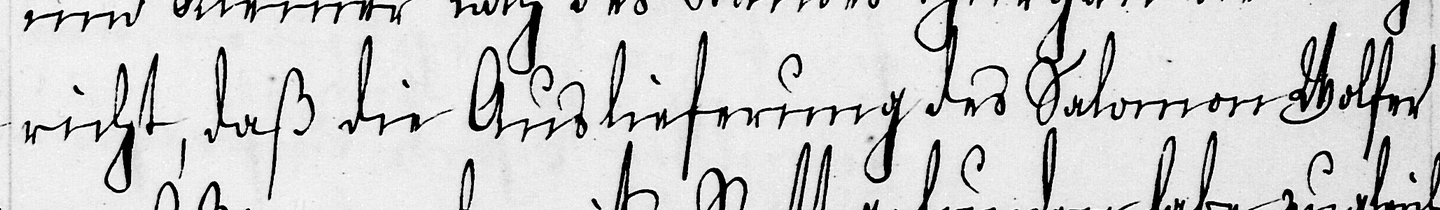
richt, daß die Auslieferung des Salomon Wolfer
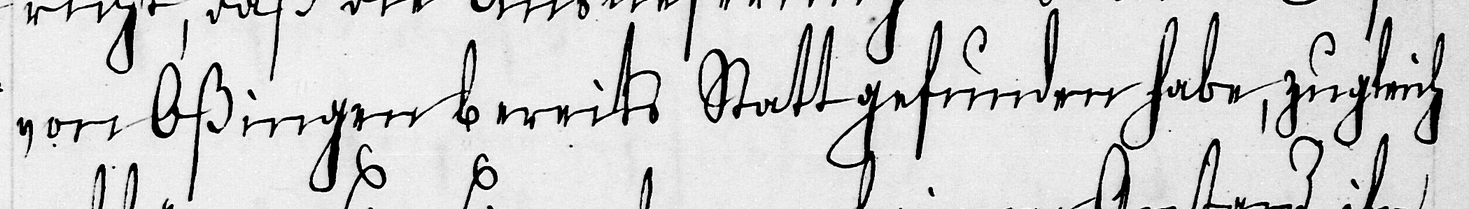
von Oßingen bereits Statt gefunden habe, zugleich
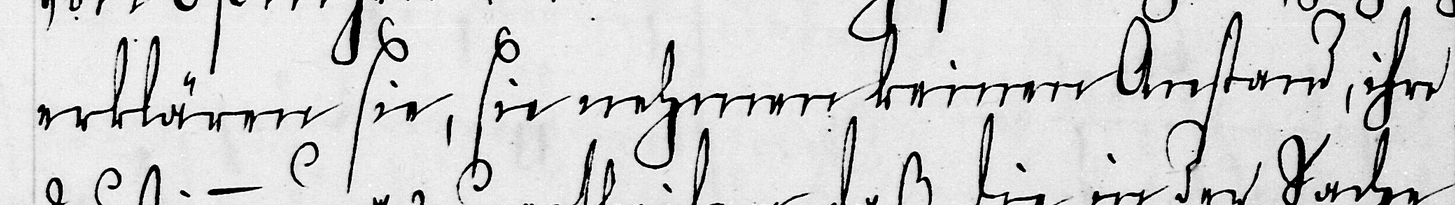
erklären sie, sie nehmen keinen Anstand, ihre
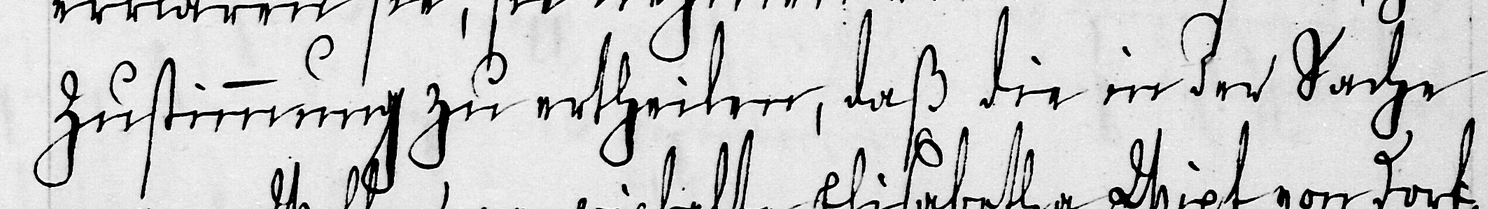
Zustimmung zu ertheilen, daß die in der Sache
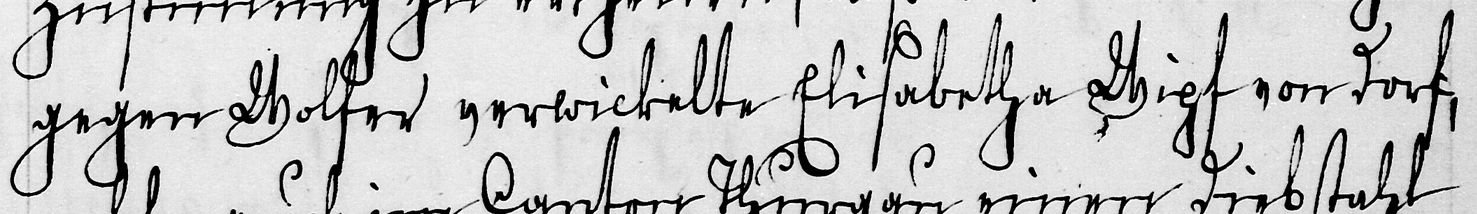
gegen Wolfer verwickelte Elisabetha Wipf von Dorf,
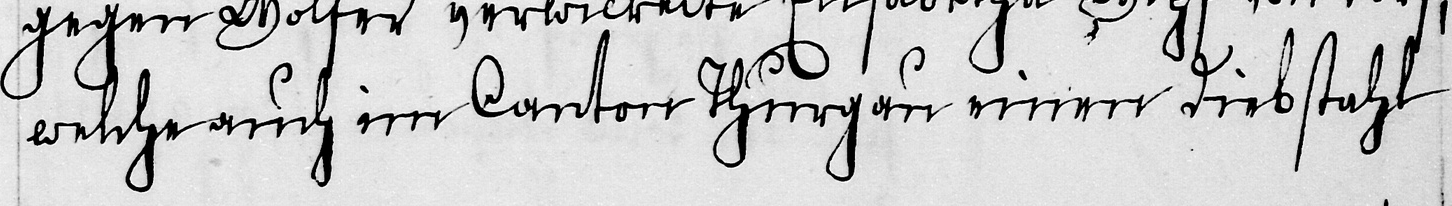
welche auch im Canton Thurgau einen Diebstahl
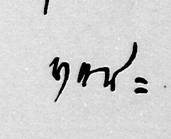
wer¬
